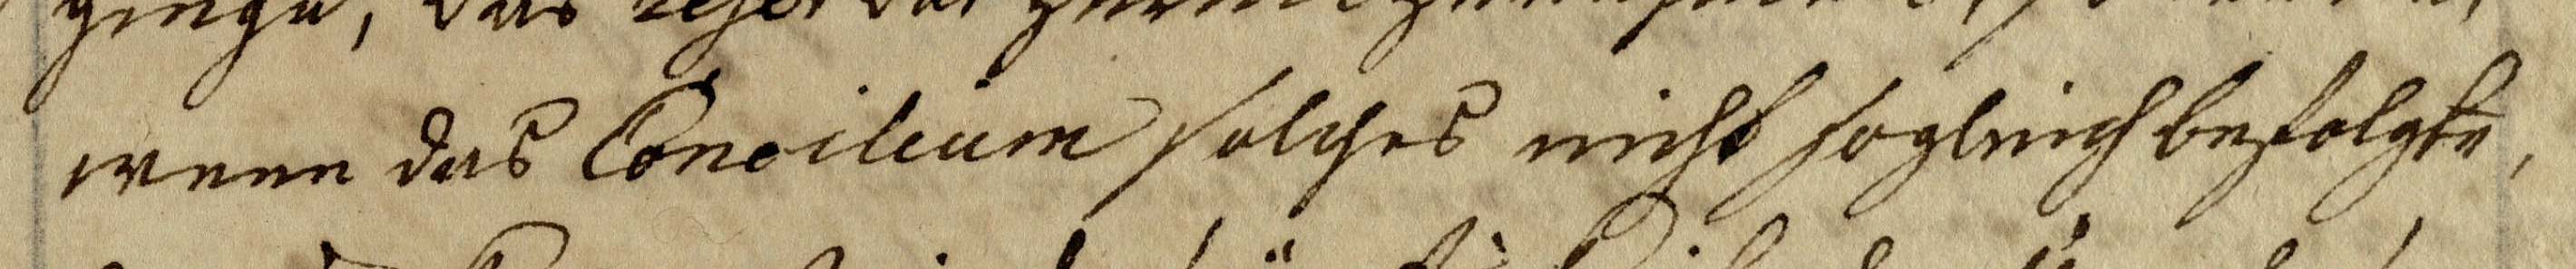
wenn das Concilium solches nicht sogleich befolgte,
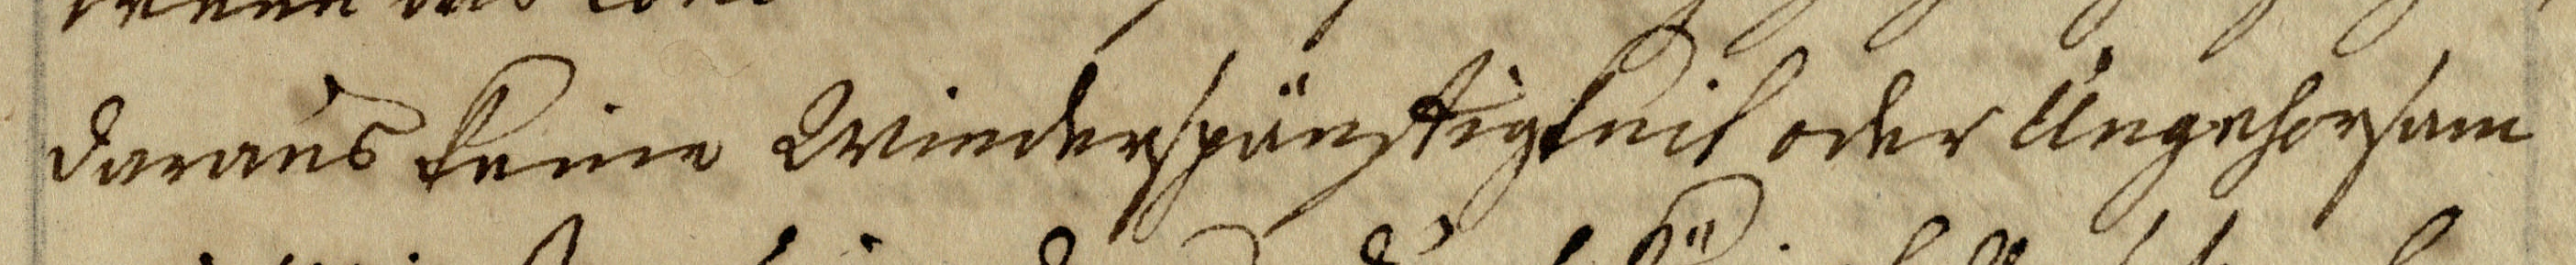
daraus keine Wiederspänstigkeit oder Ungehorsam
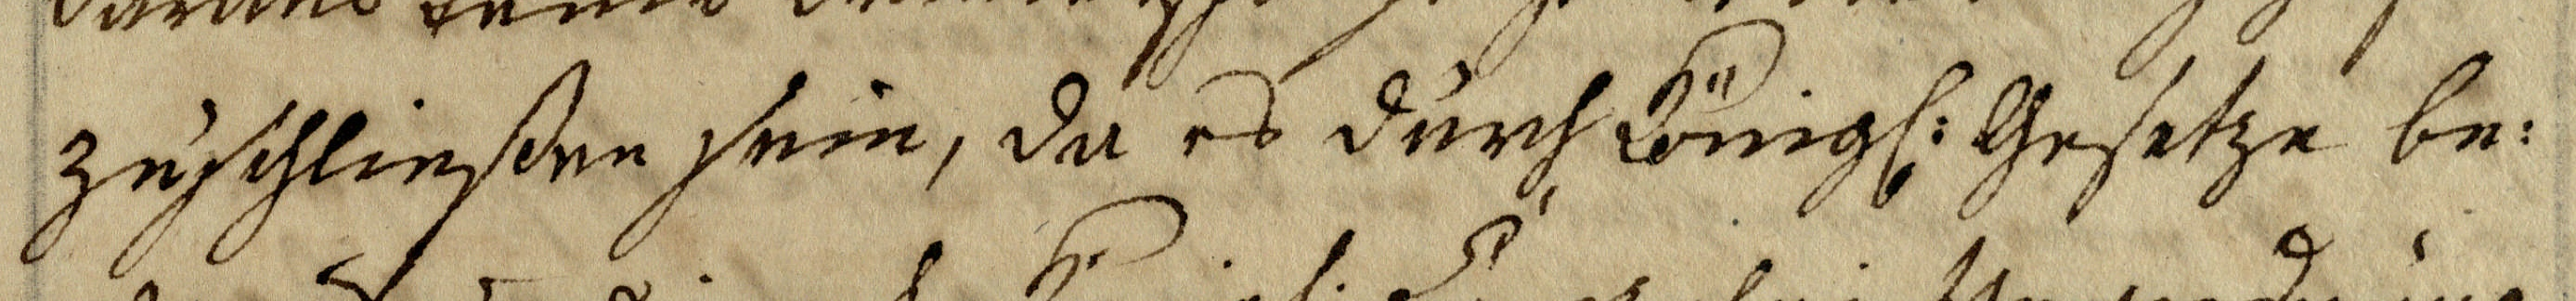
zuschließen sein, da es durch Königl. Gesetze be¬
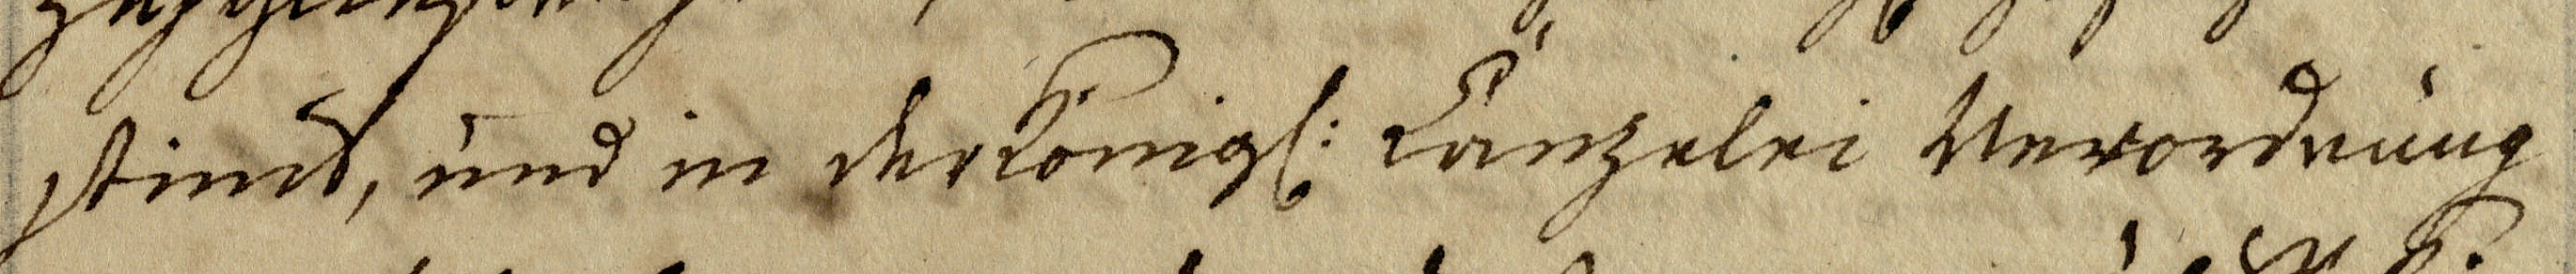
stimt, und in der Königl. Canzelei Verordnung
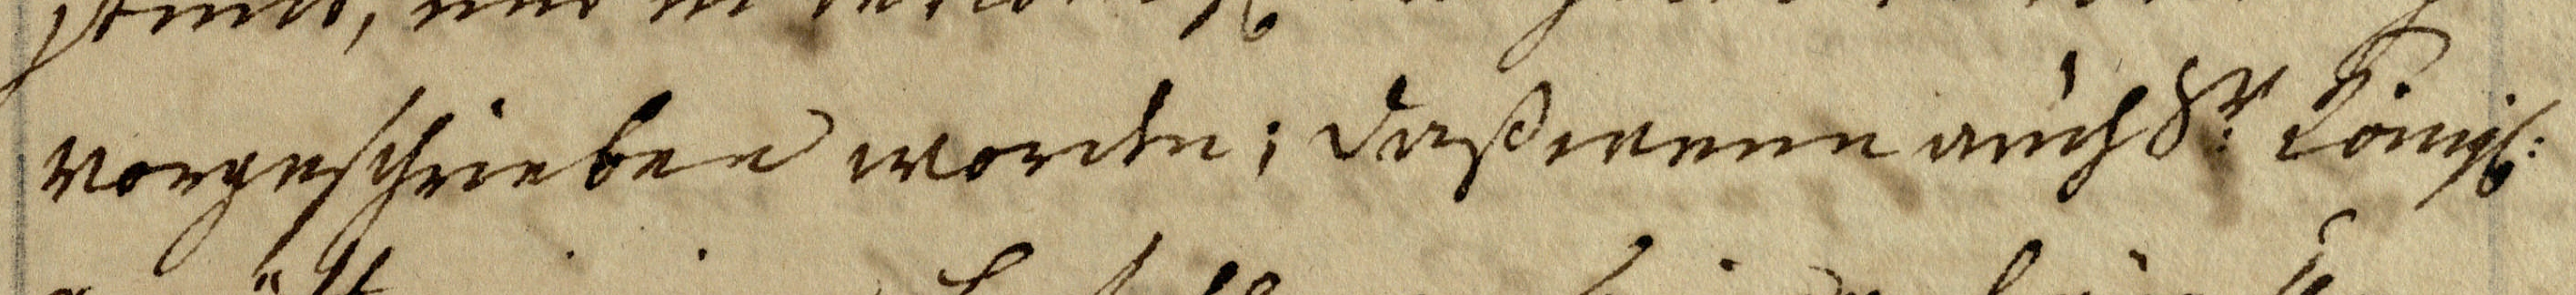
vorgeschrieben worden; daß wenn auch Sr Königl.
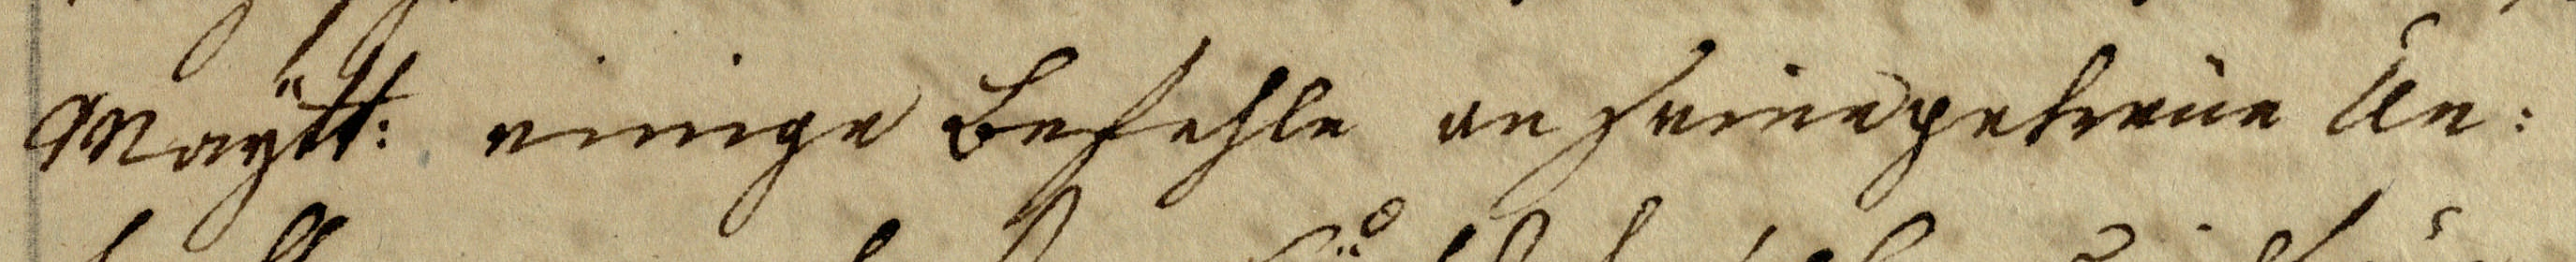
Maÿtt. einige Befehle an seine getreue Un¬
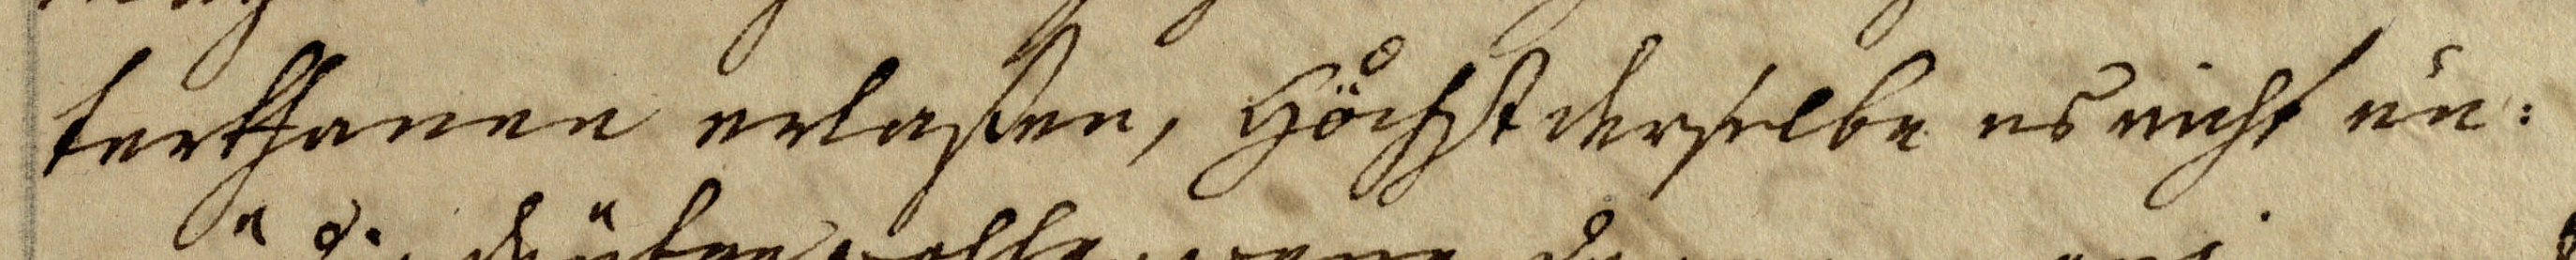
terthanen erlaßen, Höchst derselbe es nicht un¬
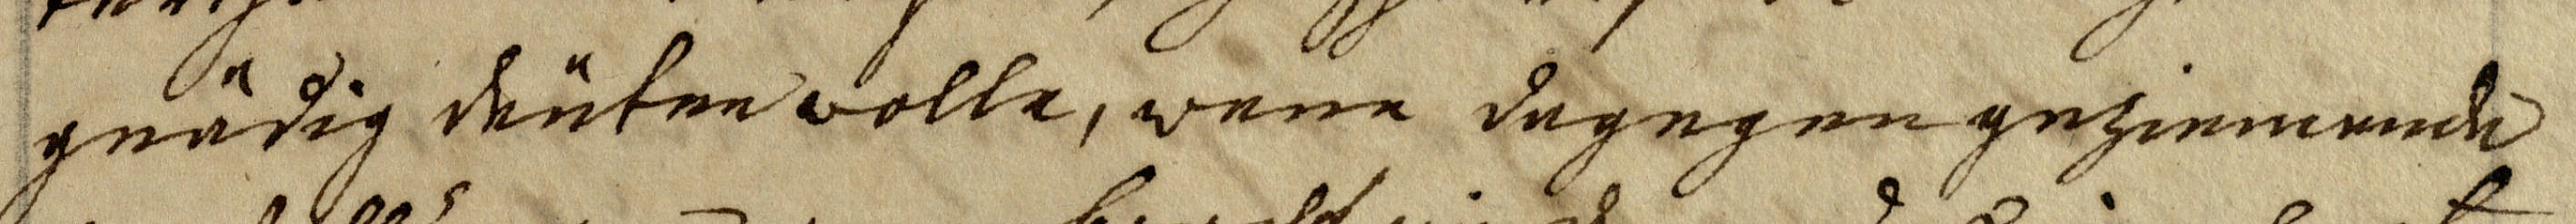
gnädig deuten wolle, wenn dagegen geziemende
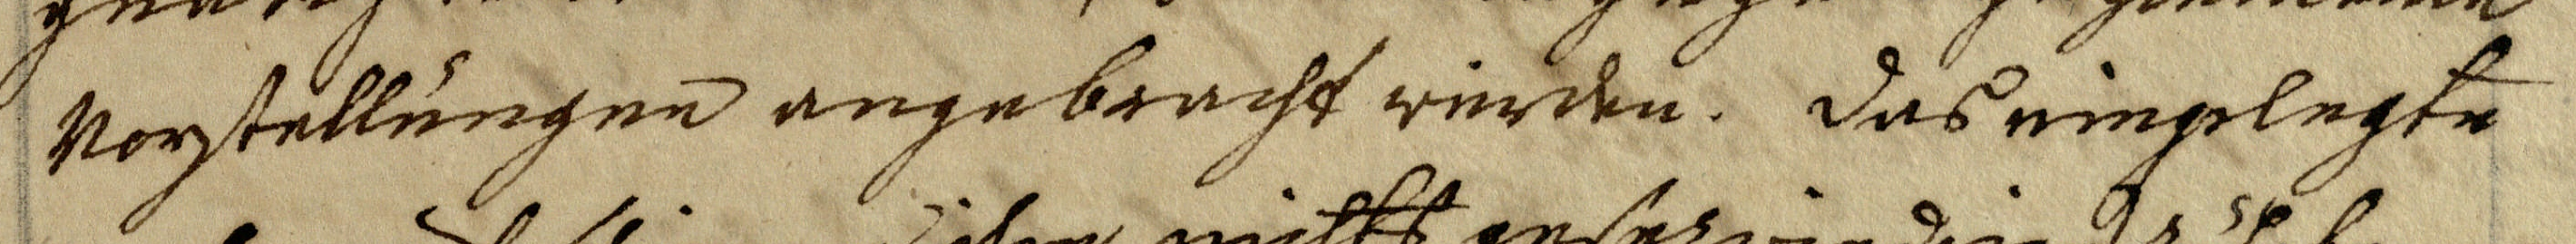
Vorstellungen angebracht würden. Das eingelegte
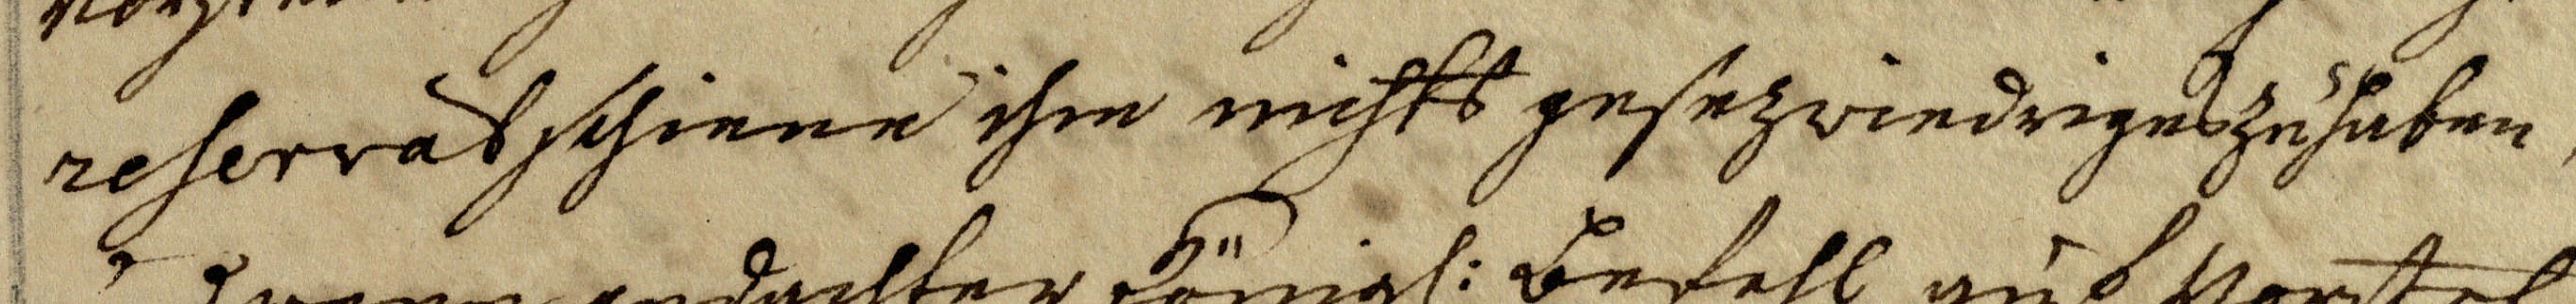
reservat schiene ihm nichts gesezwiedriges zuhaben,
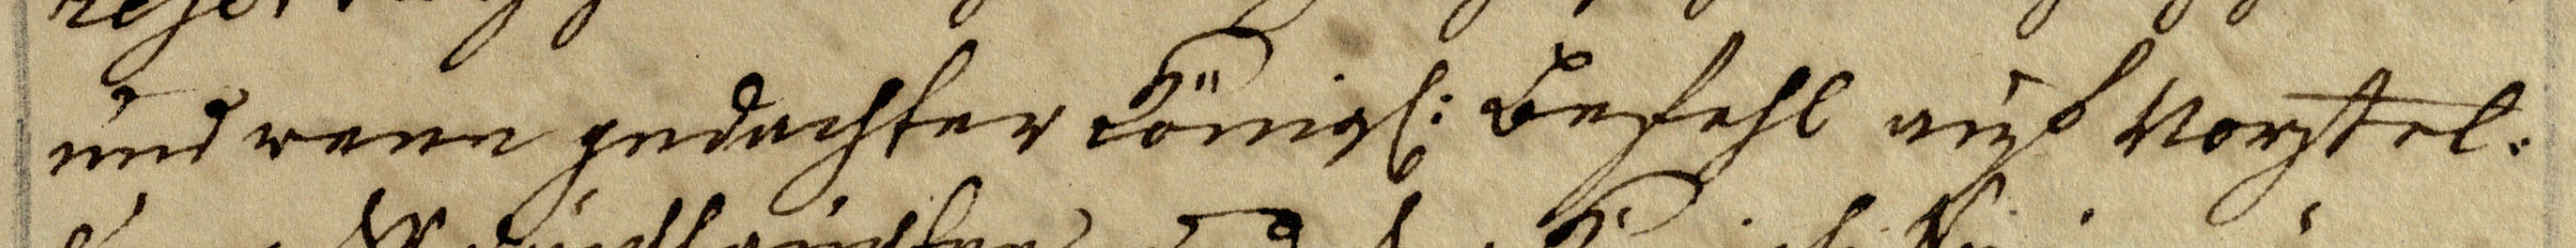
und wenn gedachter Königl. Befehl auf Vorstel¬
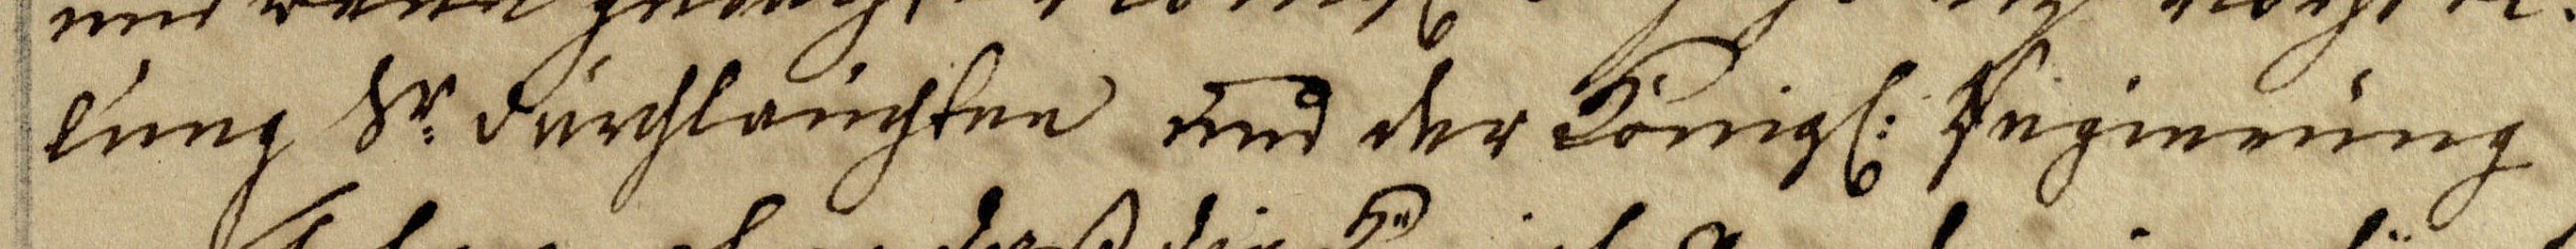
lung Sr Durchlauchten und der Königl. Regierung
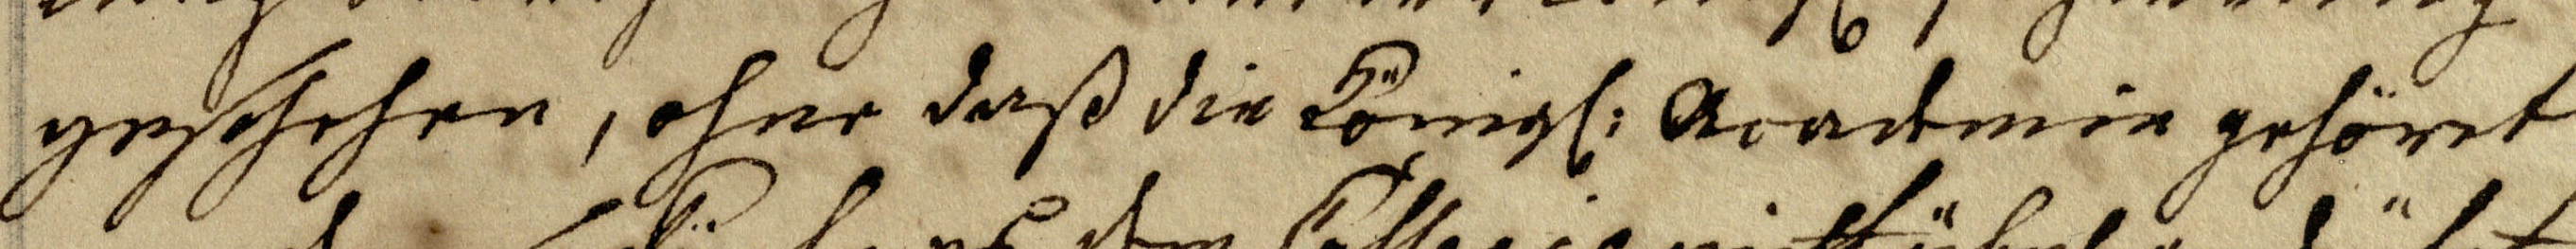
geschehen, ohne daß die Königl. Academie gehöret
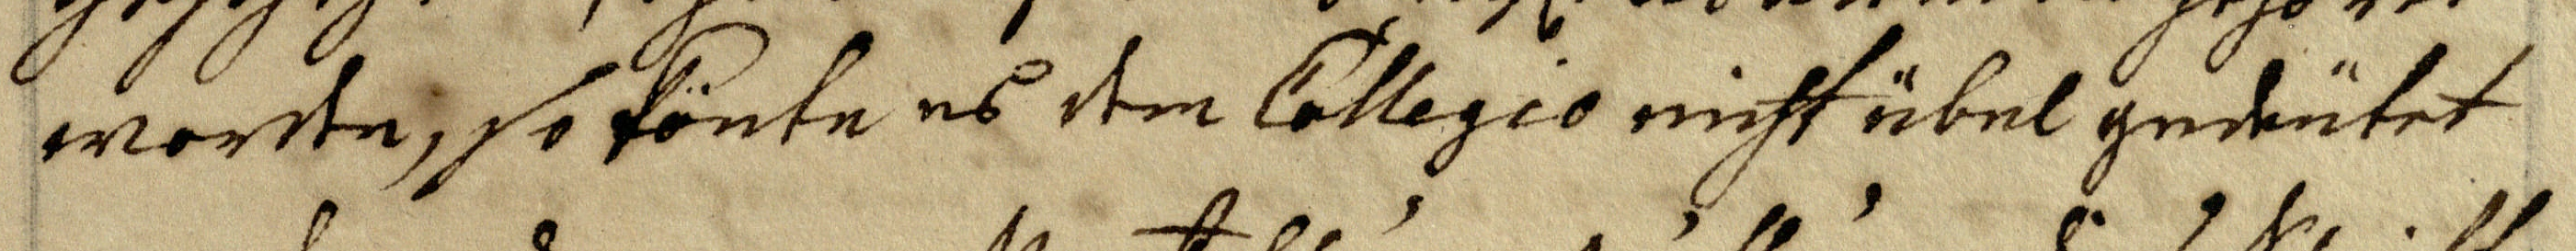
worden, so könte es dem Collegio nicht übel gedeutet
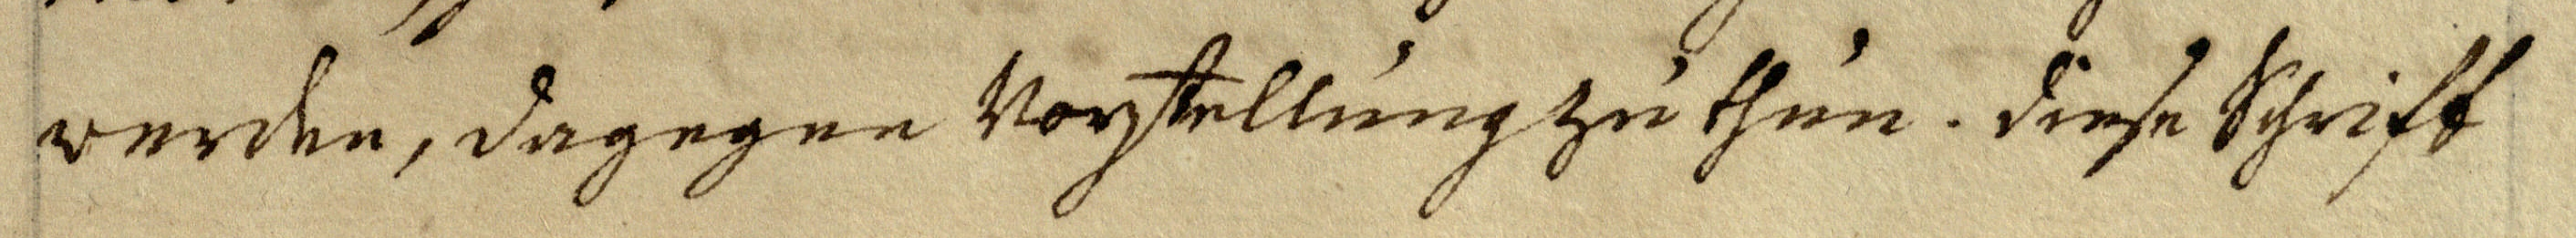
werden, dagegen Vorstellung zu thun. Diese Schrift
